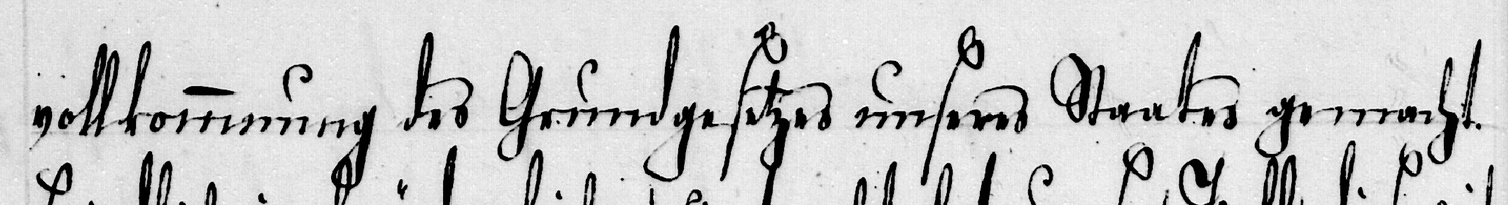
vollkommung des Grundgesetzes unseres Staates gemacht.
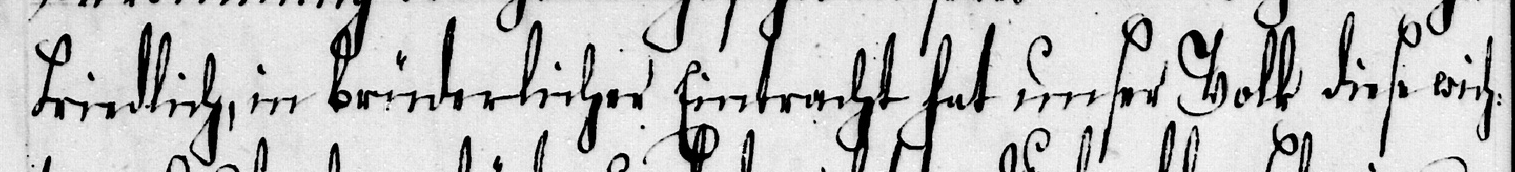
Friedlich, in brüderlicher Eintracht hat unser Volk diese wic¬
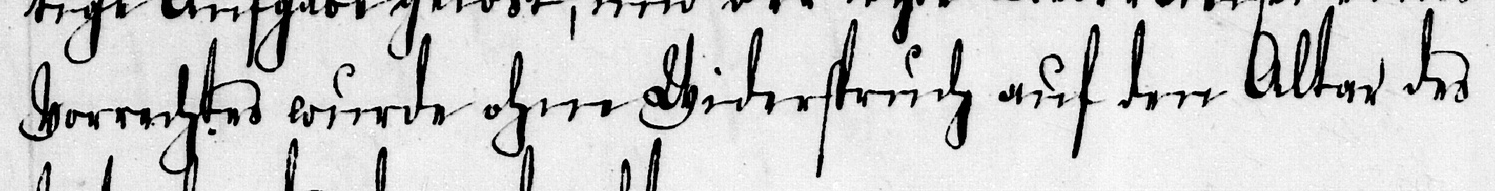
Vorrechtes wurde ohne Widerspruch auf den Altar des
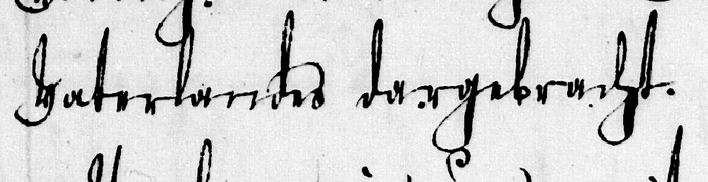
Vaterlandes dargebracht.
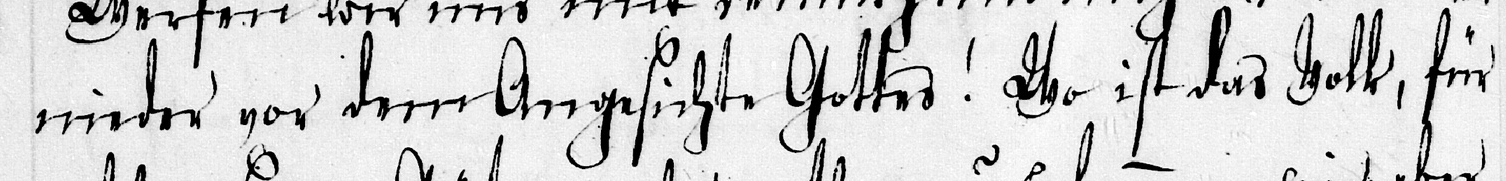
nieder vor dem Angesichte Gottes! Wo ist das Volk, für
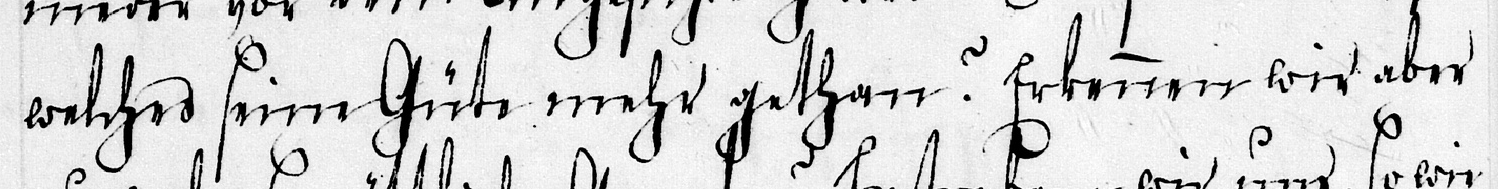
welches seine Güte mehr gethan? Erkennen wir aber
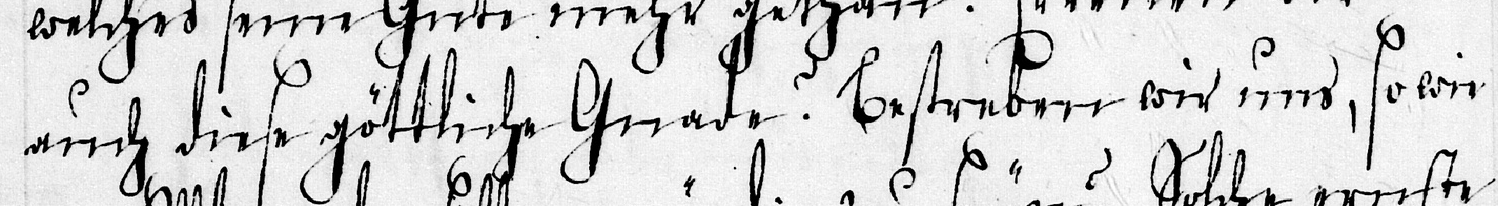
auch diese göttliche Gnade? Bestreben wir uns, so wie
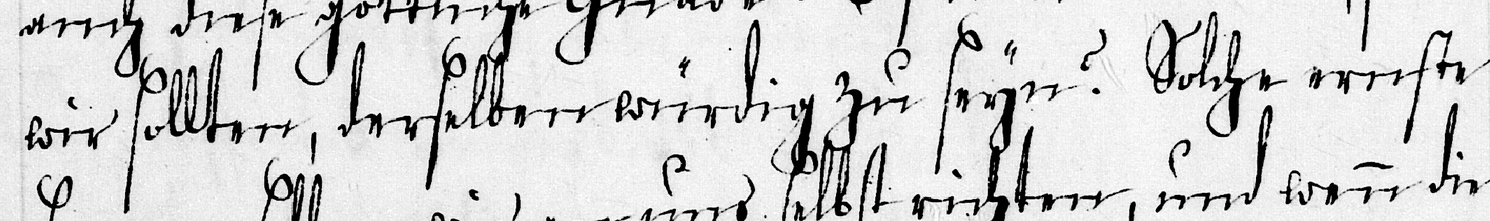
wir sollten, derselben würdig zu seyn? Solche ernste
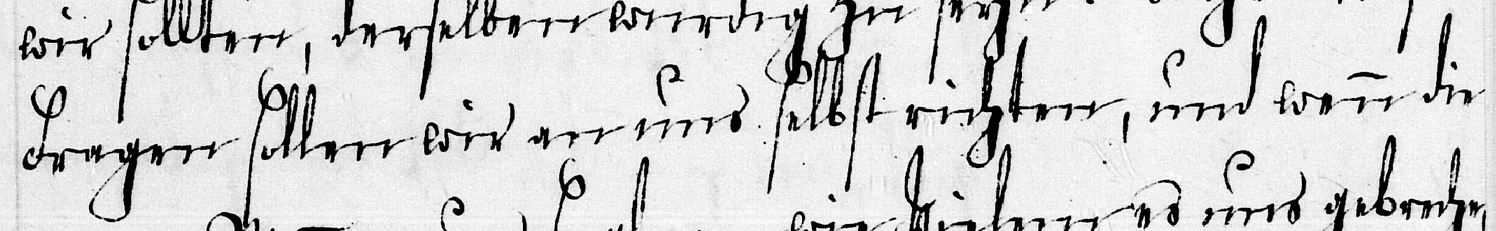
Fragen sollen wir an uns selbst richten, und wenn die
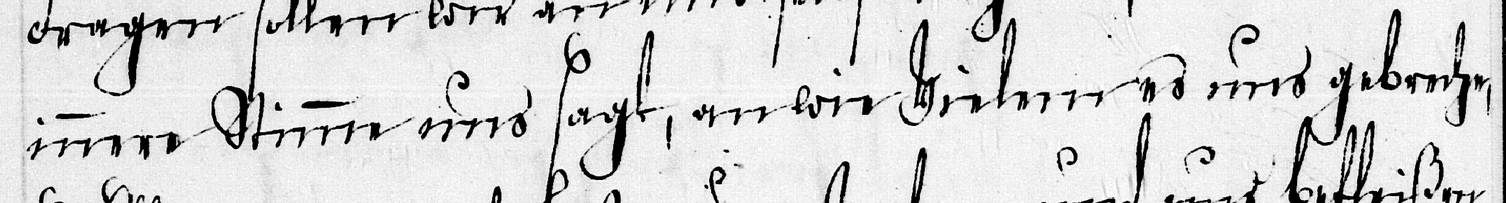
innere Stimme uns sagt, an wie Vielem es uns gebreche,
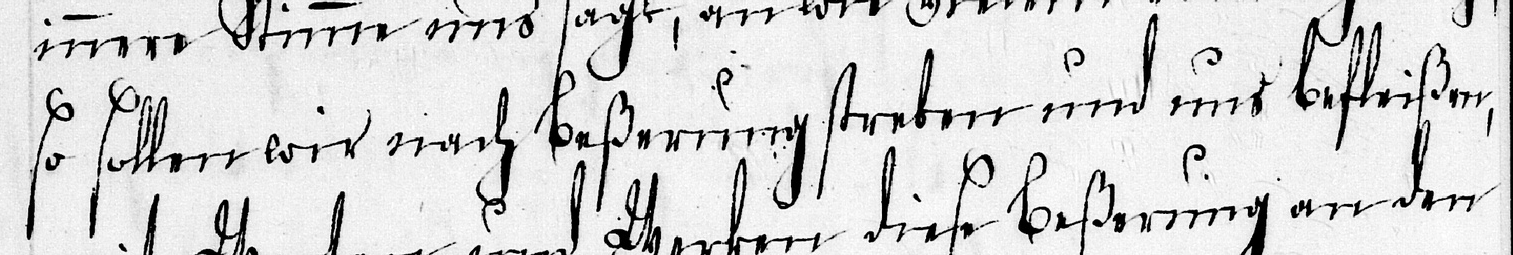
so sollen wir nach Beßerung streben und uns befleißen,
